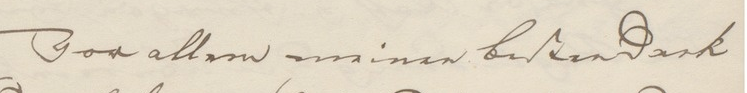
Vor allem meinen besten Dank
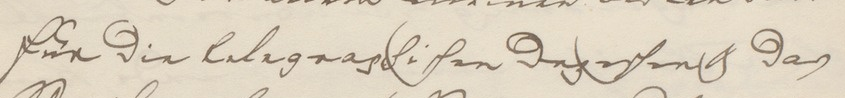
für die telegraphischen Depeschen & das
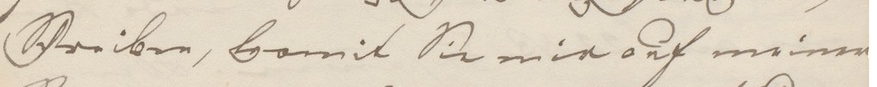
Schreiben, womit Sie mir auf meiner
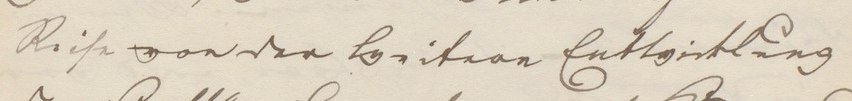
Reise von der weitern Entwicklung
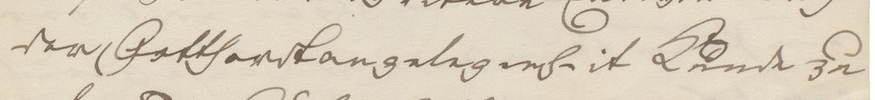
der Gotthardtangelegenheit Kunde zu
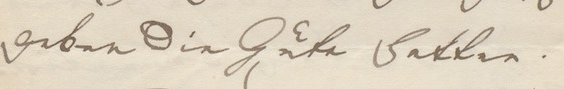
geben die Güte hatten.
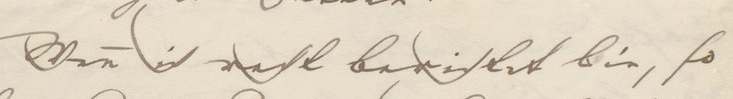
Wenn ich recht berichtet bin, so
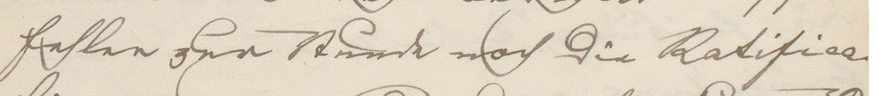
fehlen zur Stunde noch die Ratifica-
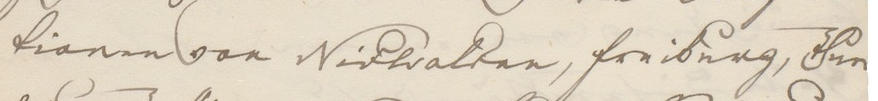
tionen von Nidwalden, Freiburg, Thur-
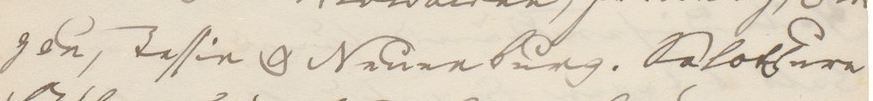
gau, Tessin & Neuenburg. Solothurn
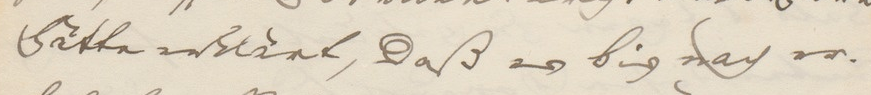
hätte erklärt, dass es bis nach er-
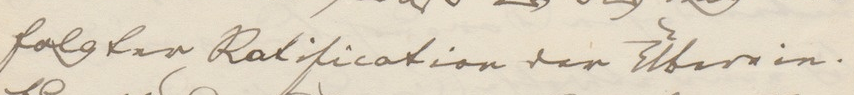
folgter Ratification der Überein-
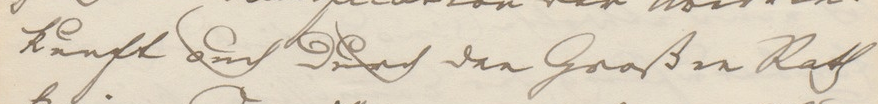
kunft auch durch den Großen Rath
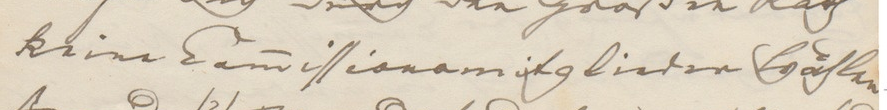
keine Commissionsmitglieder wählen
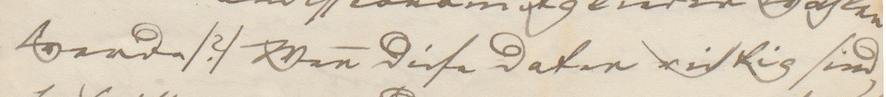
werde /?/ Wenn diese Daten richtig sind,
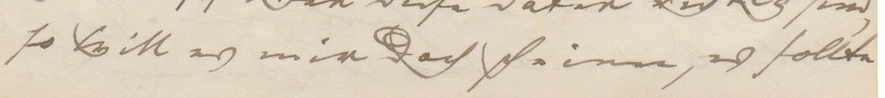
so will es mir doch scheinen, es sollte
